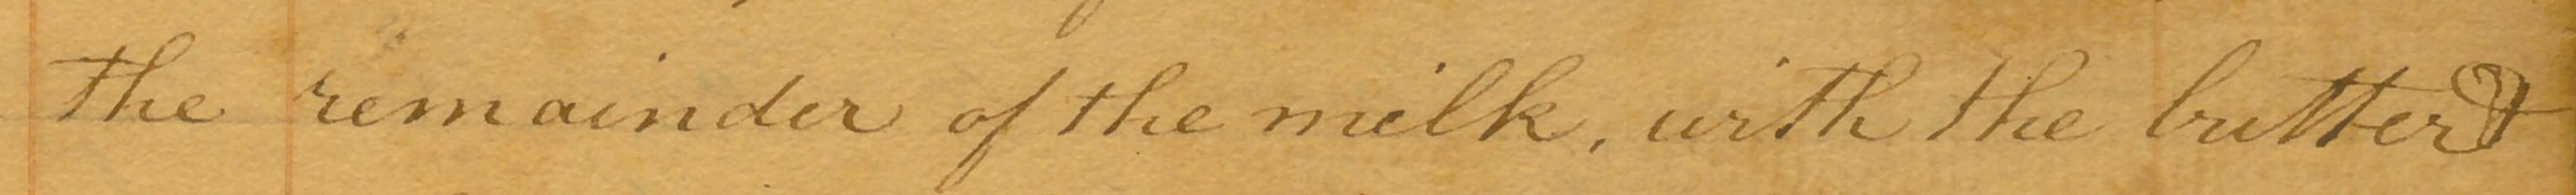the remainder of the milk, with the butter &
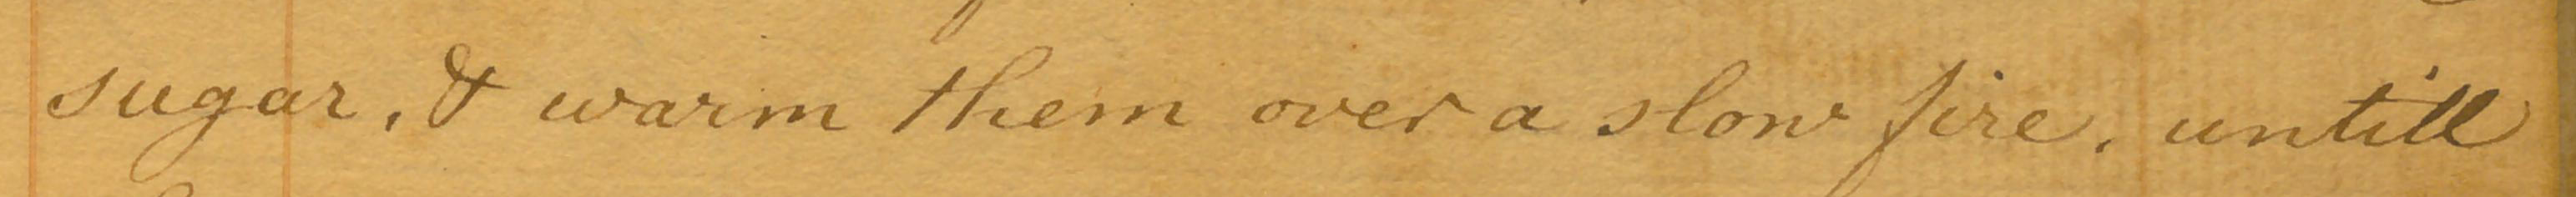sugar, & warm them over a slow fire, untill
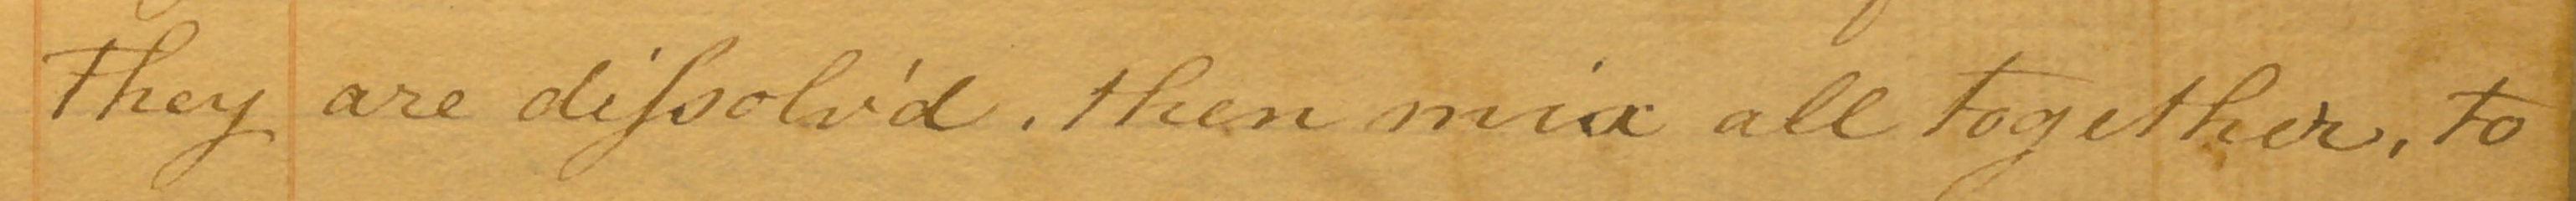they are dissolv'd, then mix all together, to
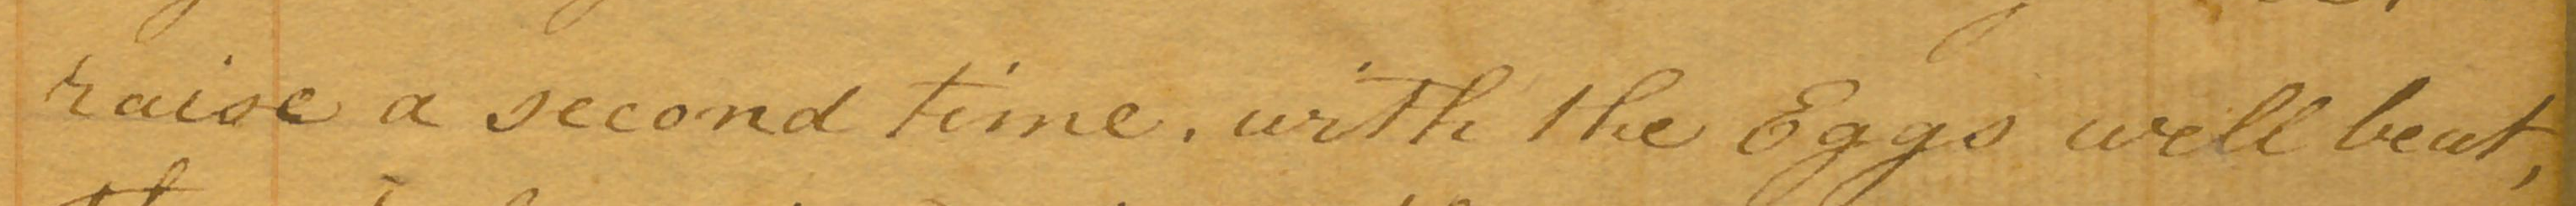raise a second time, with the Eggs well beat,
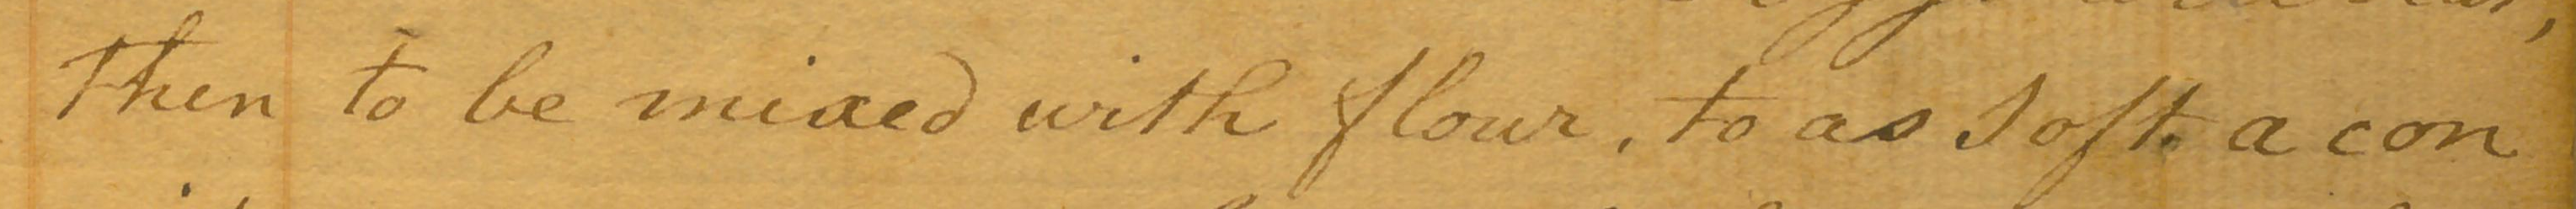then to be mixed with flour, to as soft a con
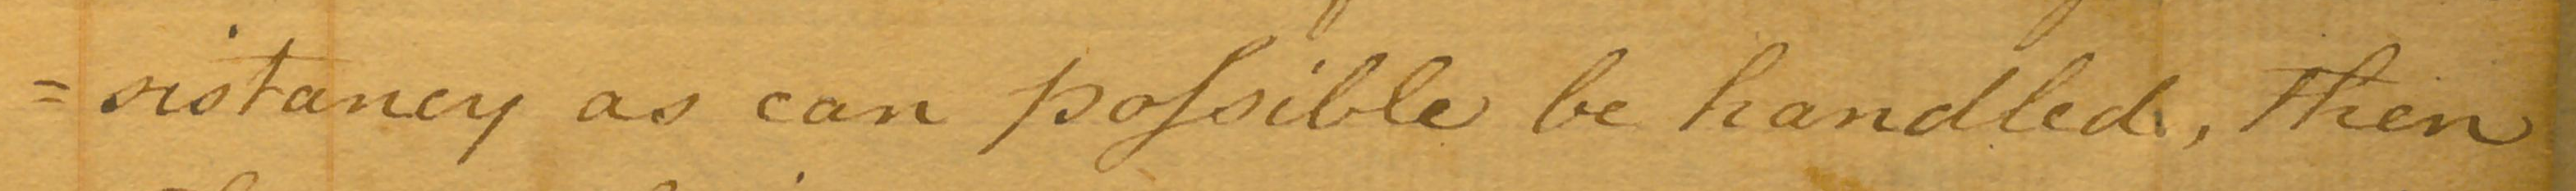-sistancy as can possible be handled, then
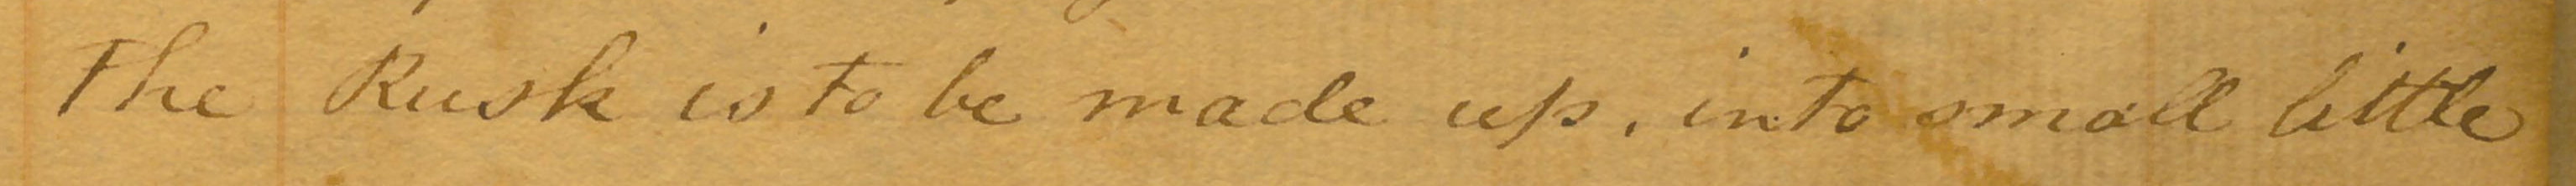the Rusk is to be made up, into small little
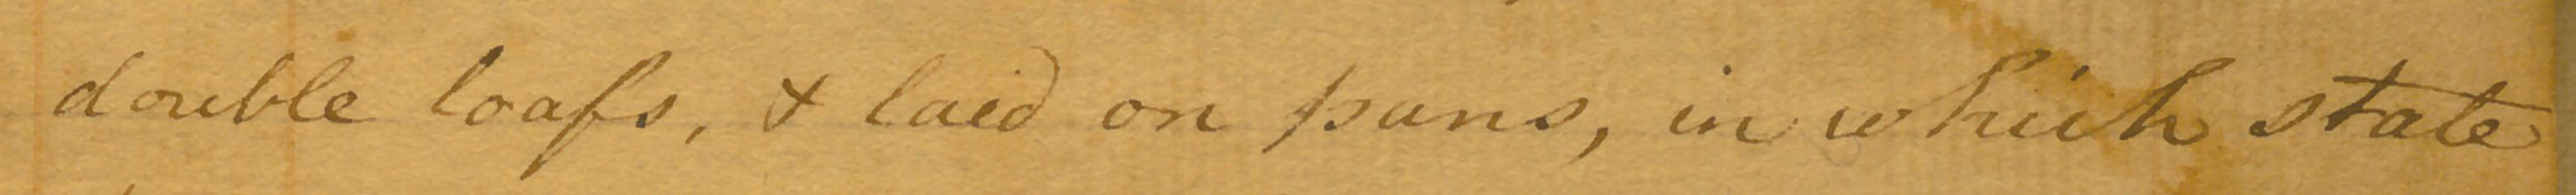double loafs, & laid on pans, in which state
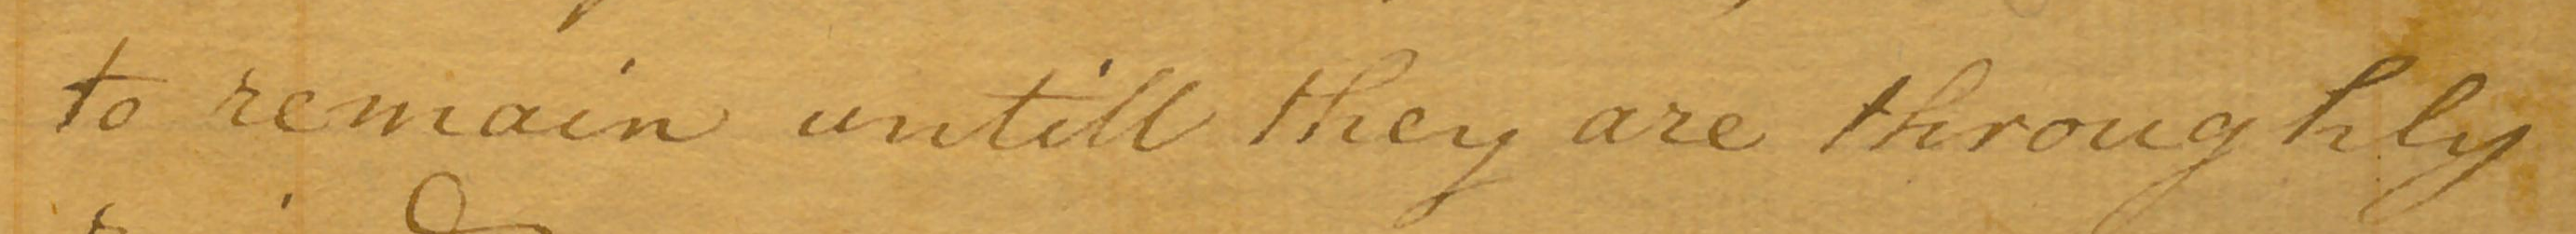to remain untill they are throughly
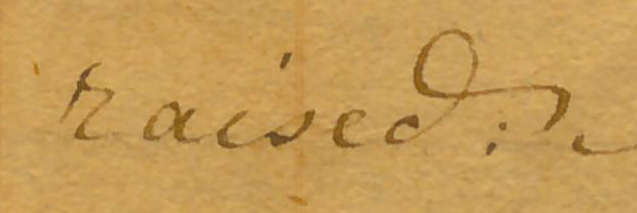raised:
